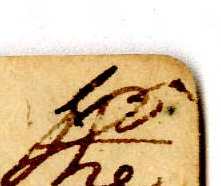45
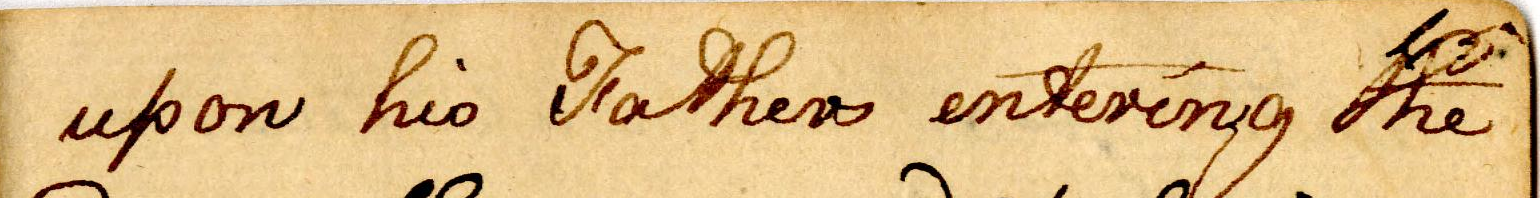upon his Fathers entering the
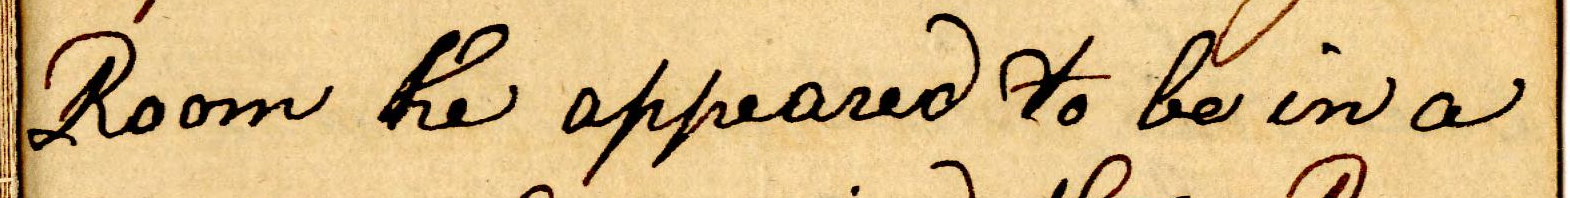Room he appeared to be in a
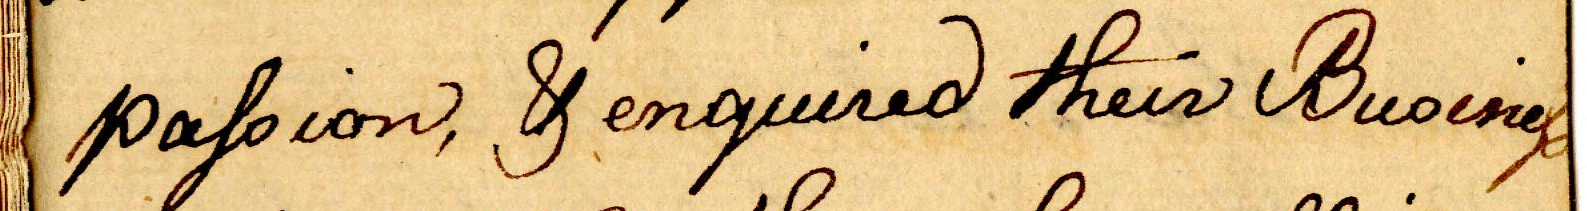passion, & enquired their Business
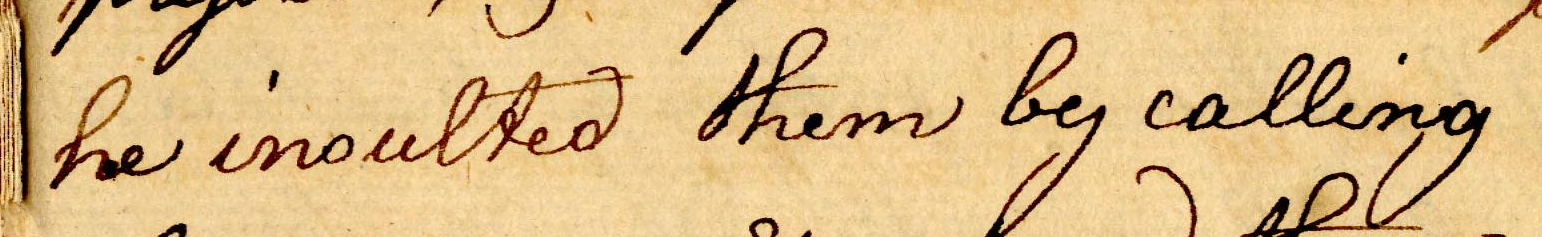he insulted them by calling
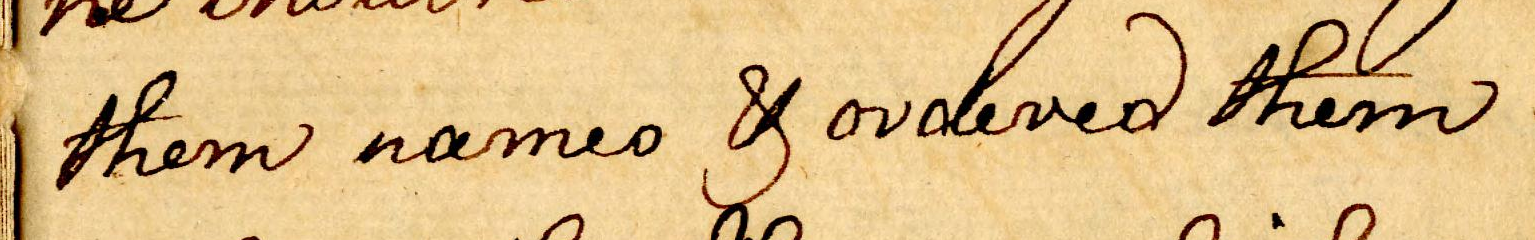them names & ordered them
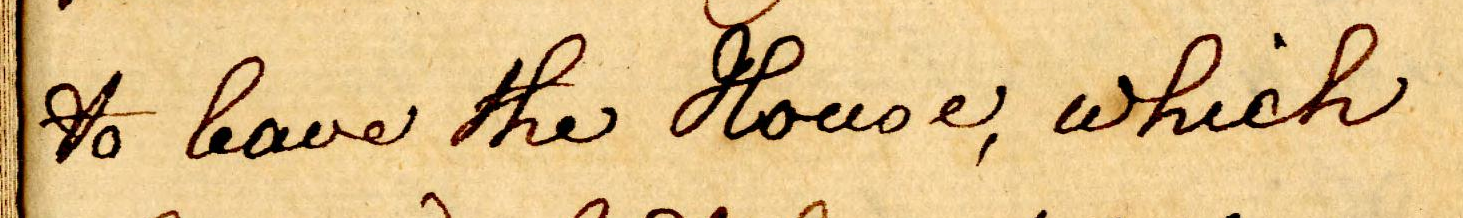to leave the House, which
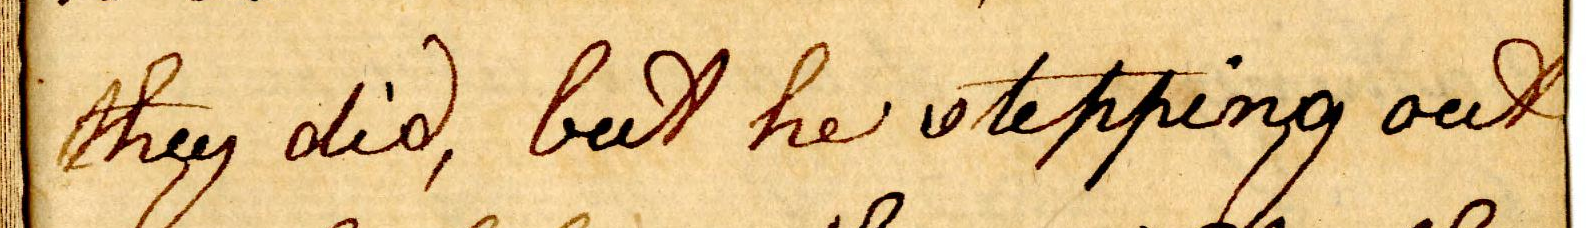they did, but he stepping out
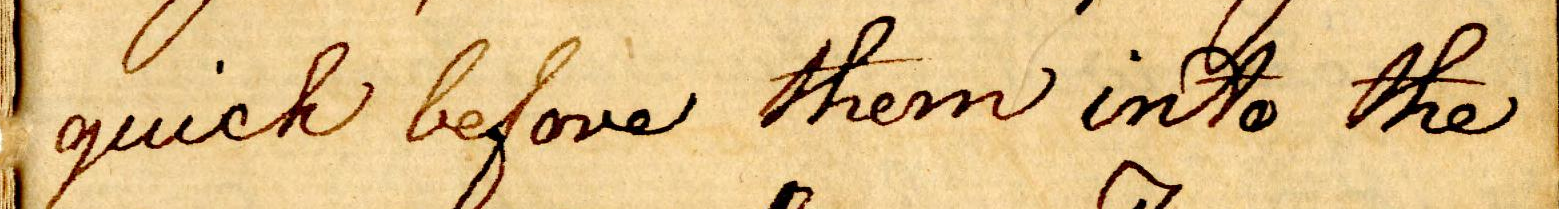quick before them into the
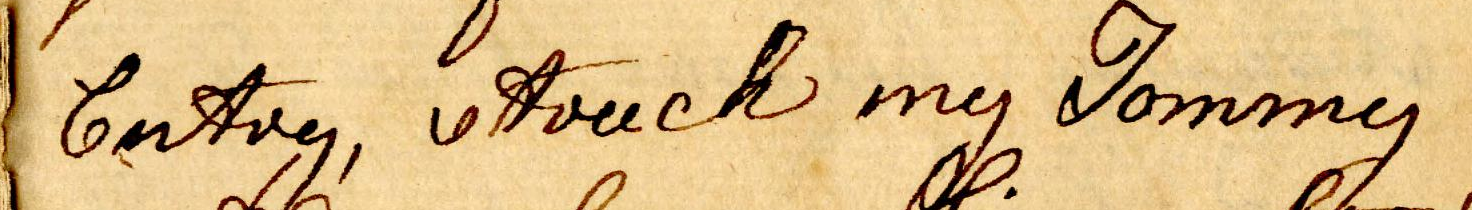Entry, struck my Tommy
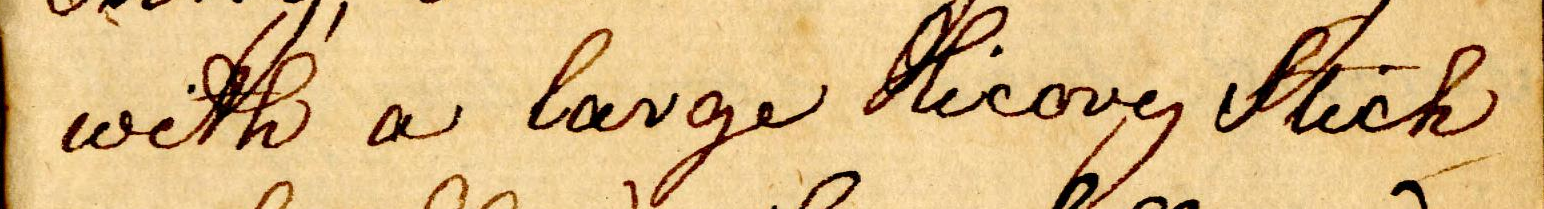with a large Hicory Stick
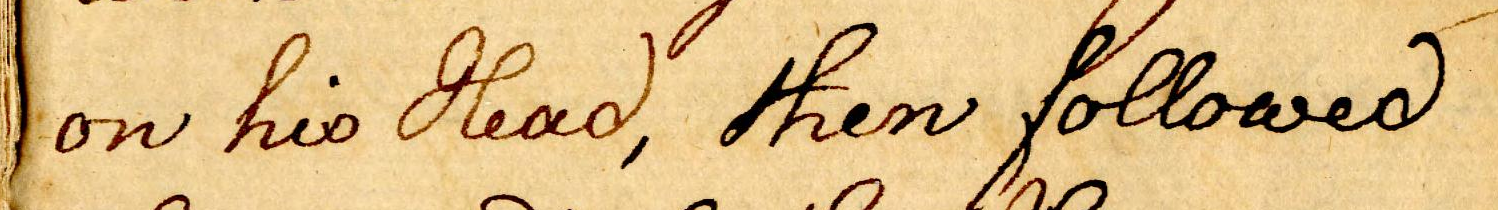on his Head, then followed
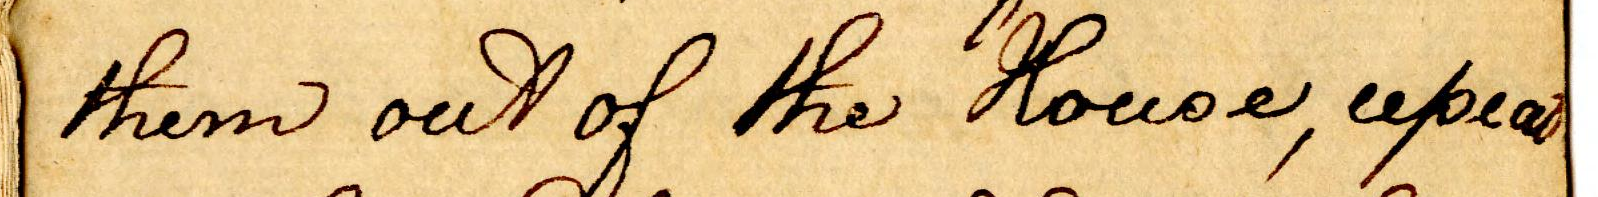them out of the House, repeat
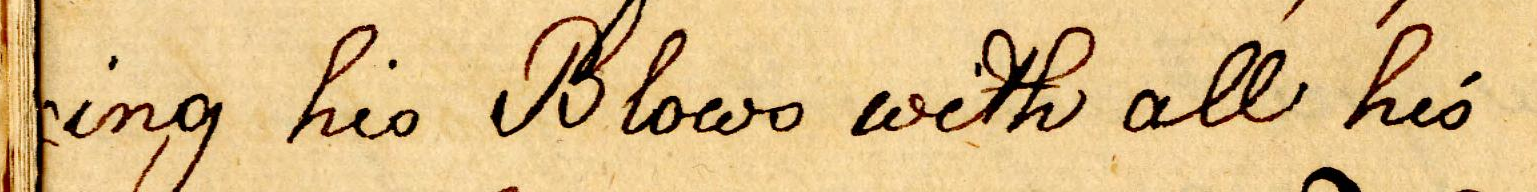-ing his Blows with all his
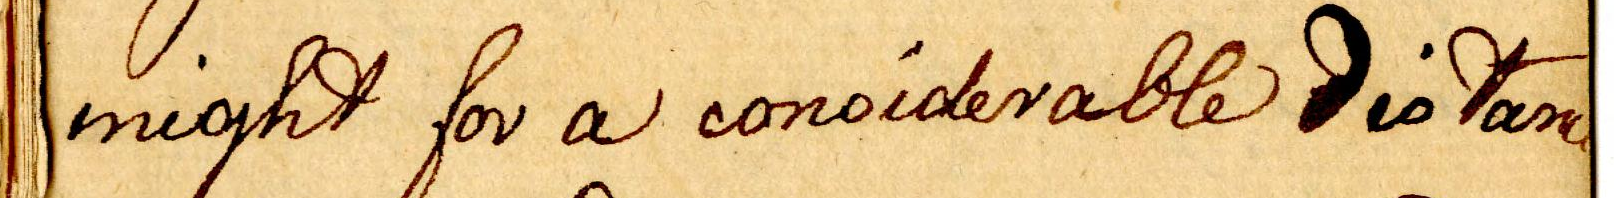might for a considerable distance
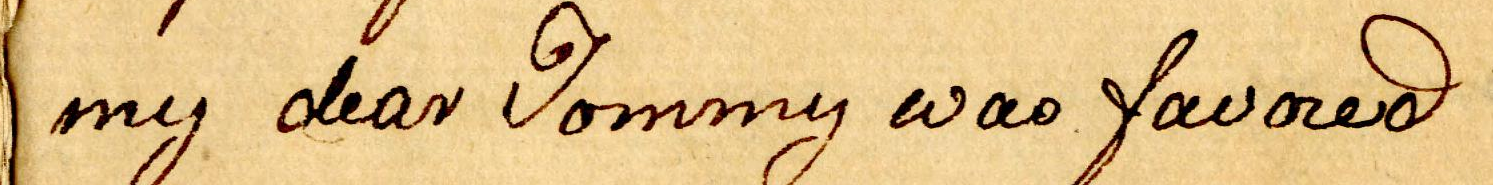my dear Tommy was favored
